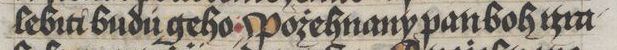lebiti budú geho.Pożehnany pan boh izra¬
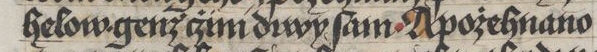helow.genż cżiní diwy ſam.A pożehnano
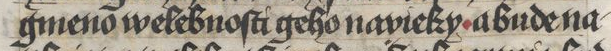gmeno welebnoſti geho navieky.a bude na¬
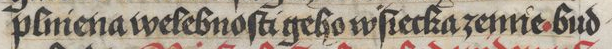plniena velebnoſti geho wẛiecka zemie.bud¬
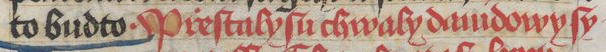to budto.Pṙeſtaly ſu chwaly davidowy ſy¬
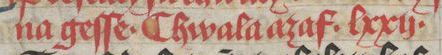na geſſe.Chwala azaf.lxxii.
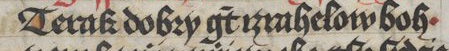Terak dobry ḡt izrahelow boh.
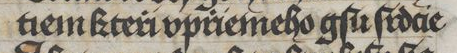tiem kteṙí vpṙiemeho gſu ſrdcie
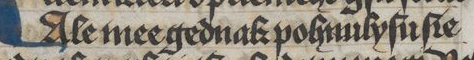Ale mee gednak pohnulyſu ſíe
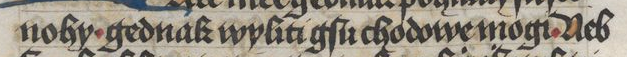nohy.gednak wyliti gſu chodowé mogi.Neb
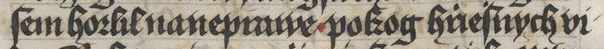ſem horlil naneprawe.pokog hṙieẛnych vi¬
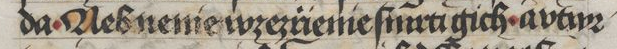da.Neb nenie wzezṙienie ſmrti gich.a vtwr¬
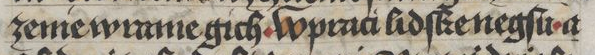zenie wranie gich.wpraci lidſke negſu.a
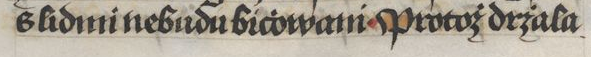s lidmi nebudu biċowani.Protoż drżala
